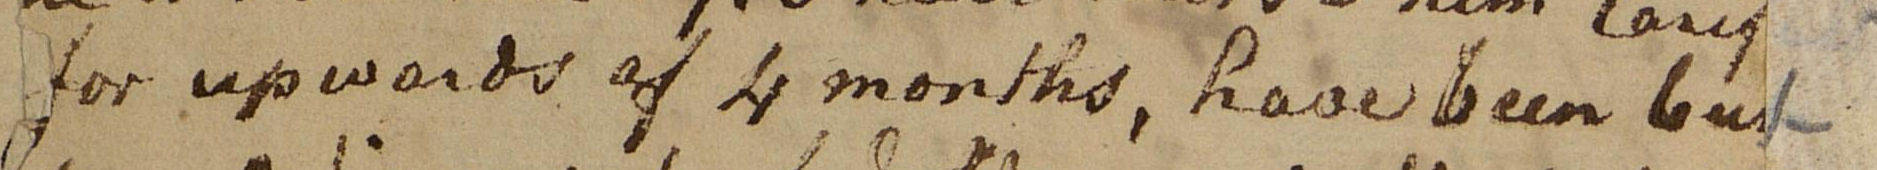for upwards of 4 months, have been but
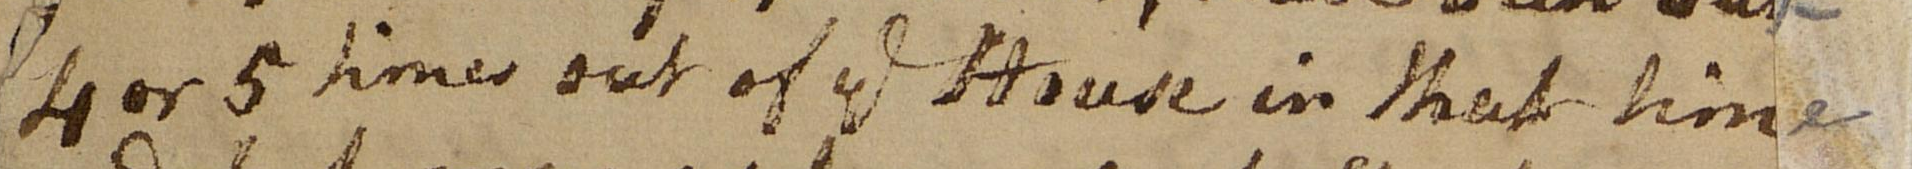4 or 5 times out of y^e Hour in that time
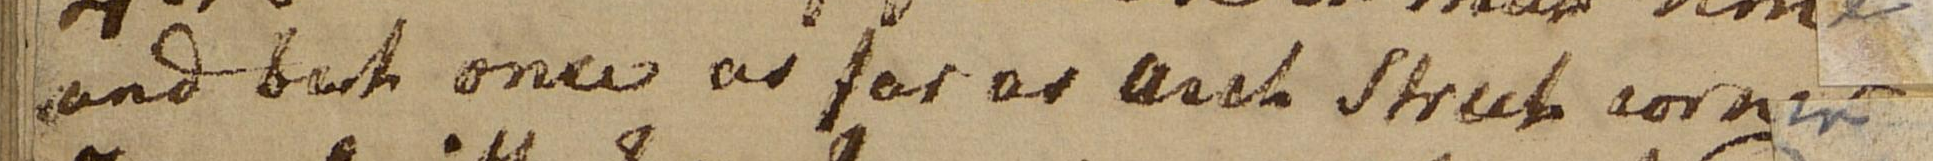and but once as far as Arch Street corner
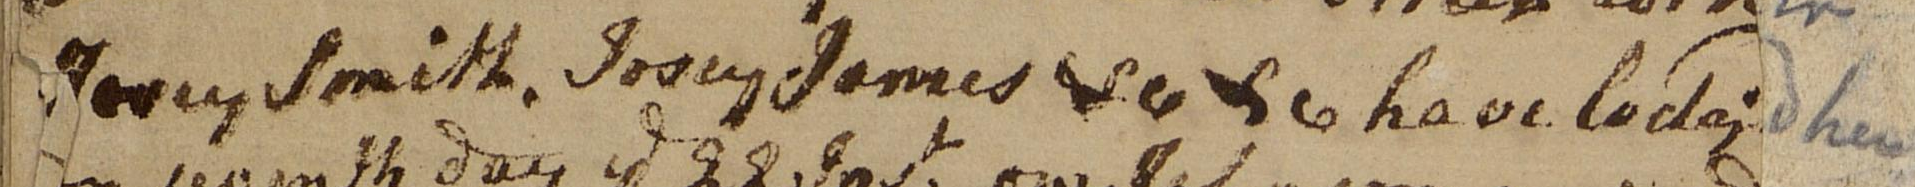Josey Smith, Josey James &c &c have lodg'd her
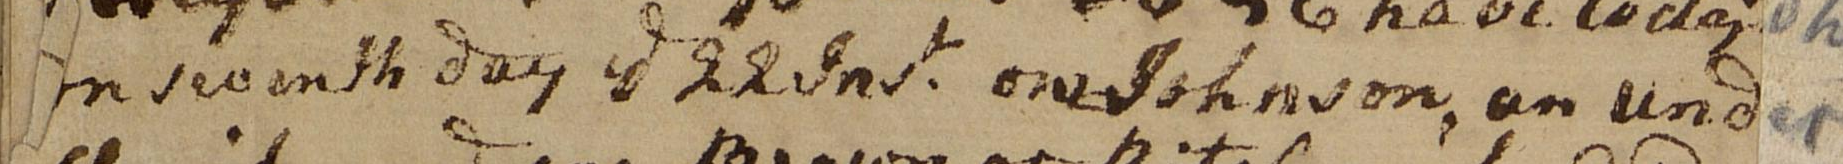on seventh day y^e 22 Ins^t. one Johnson, an under
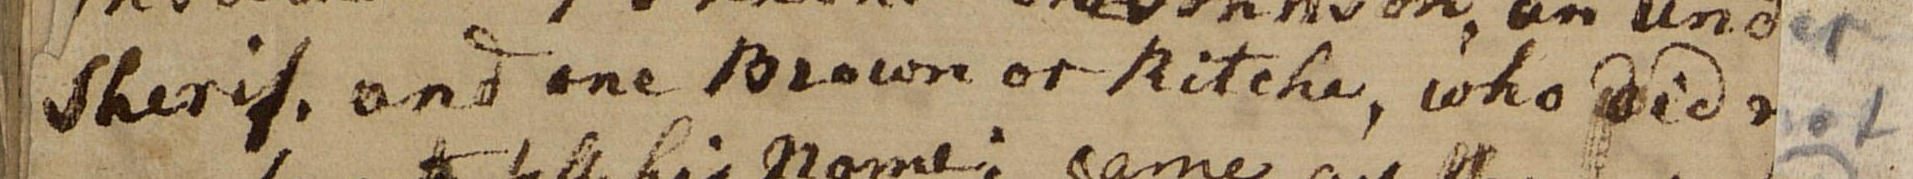Sherif, and one Brown or Ritche, who did not
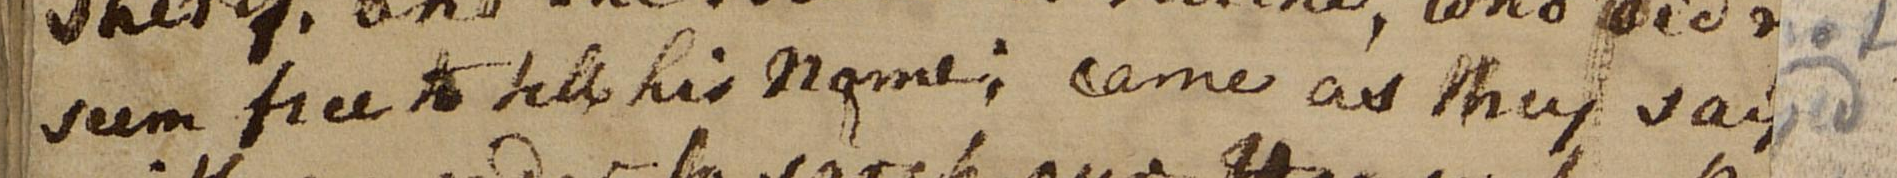seem free to tell his name: came as they say'd
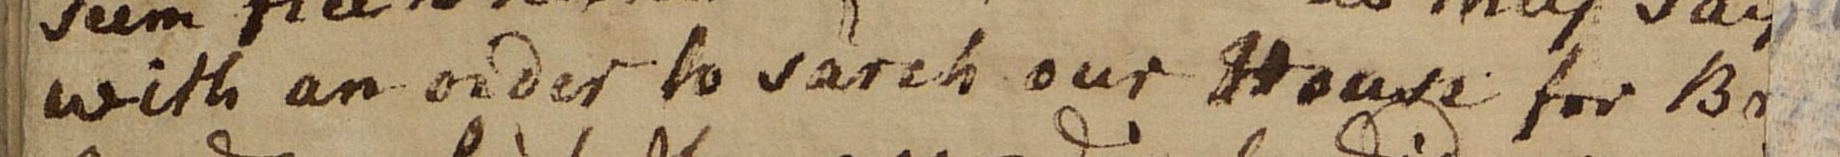with an order to sarch our House for Br
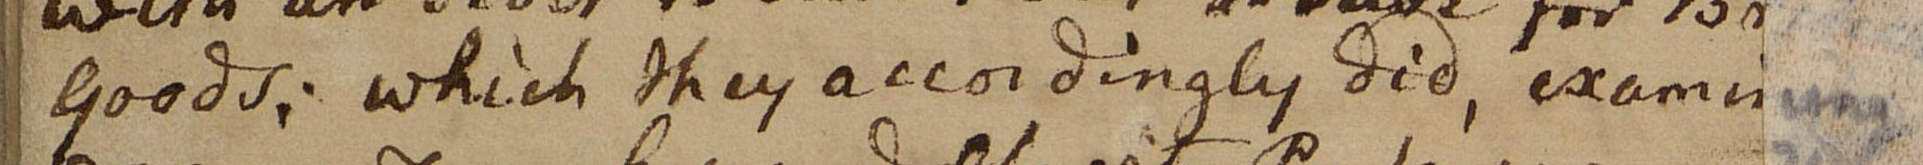Goods; which they accordingly did, examining
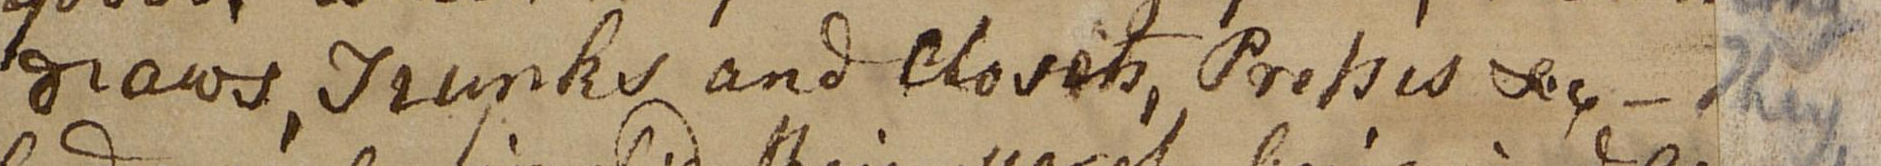draws, Trunks and Closets, Pressis &c- they
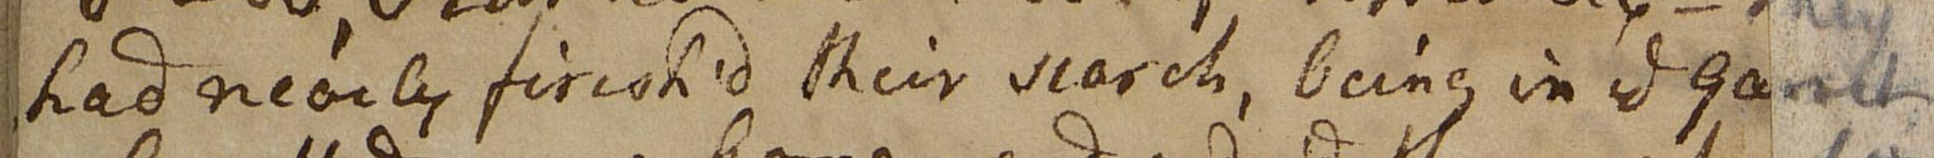had nearly finish'd their search, being in y^e garnt
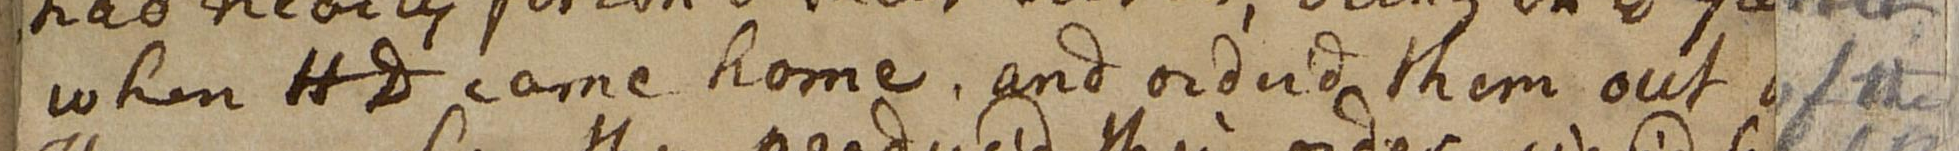when HD came home, and order'd them out of the
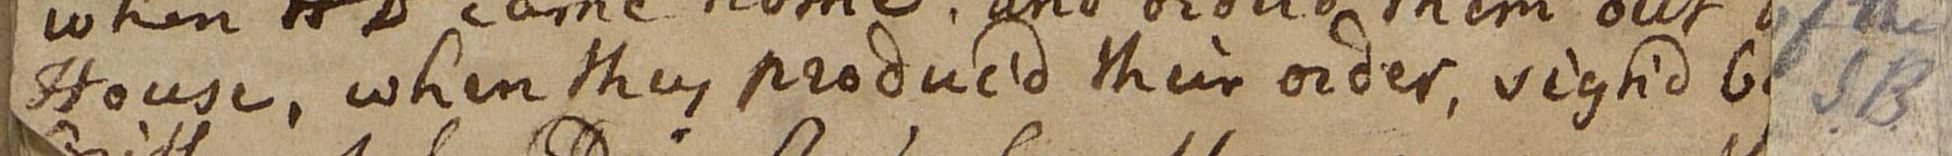House, when they produc'd their order, sigh'd C S.B.
